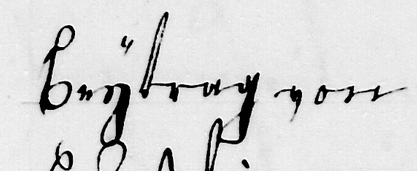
Beytrag von
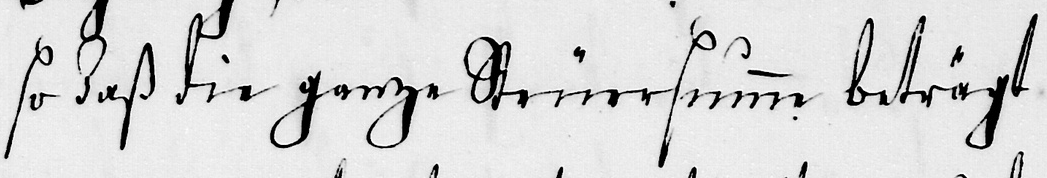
so daß die ganze Steuersumme beträgt
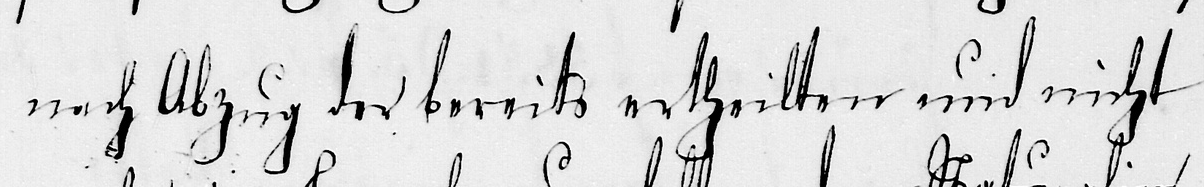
nach Abzug der bereits ertheilten und nicht
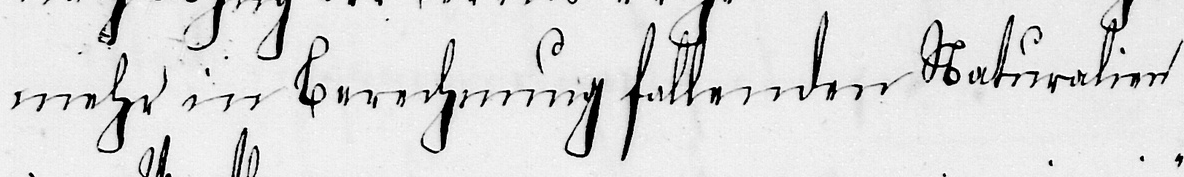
mehr in Berechnung fallenden Naturalien
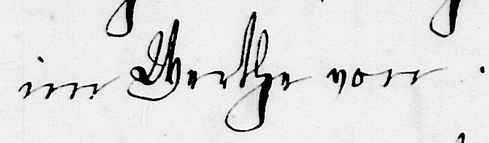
im Werthe von
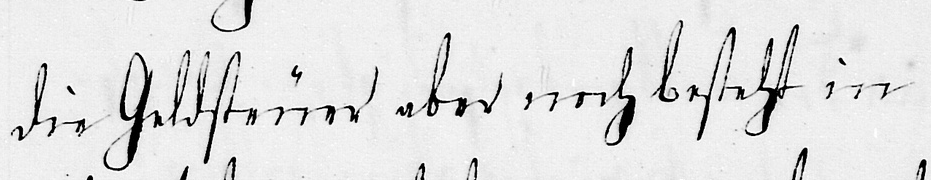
die Geldsteuer aber noch besteht in
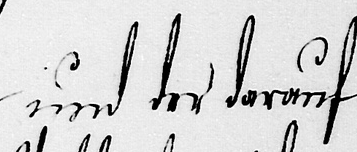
und der dar¬
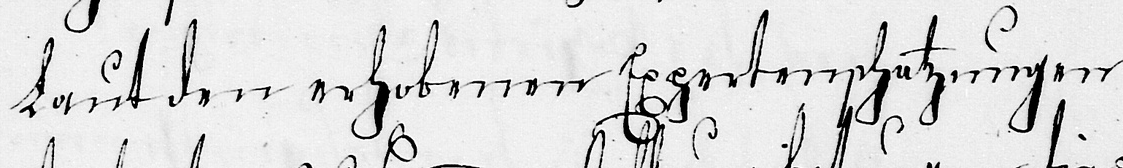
Laut den erhobenen Expertenschätzungen
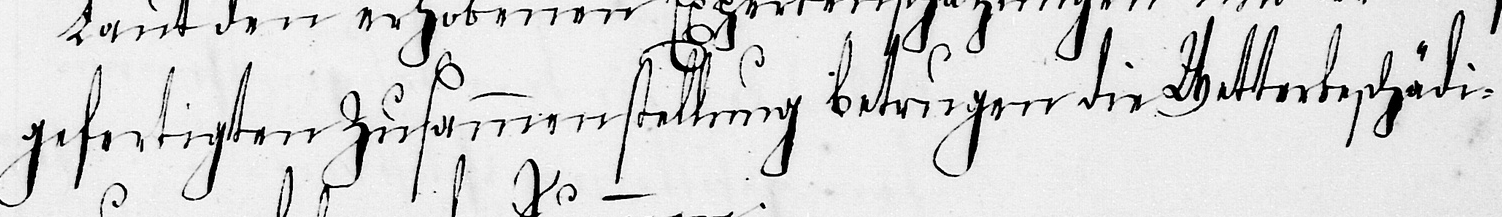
gefertigten Zusammenstellungen betrugen die Wetterbeschädi¬
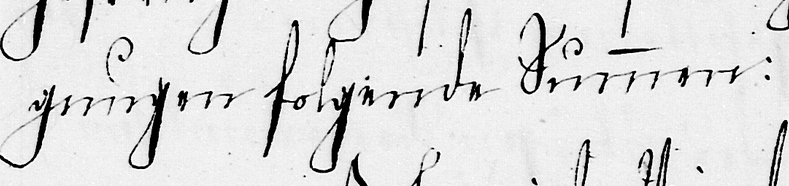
gungen folgende Summen:
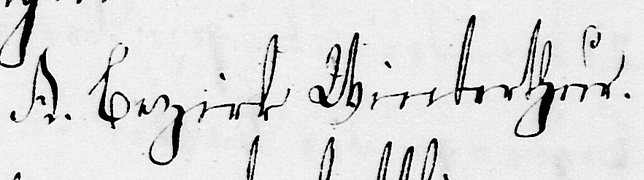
A. Bezirk Winterthur.
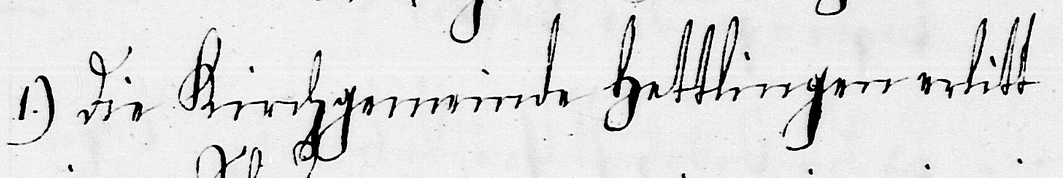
1.) Die Kirchgemeinde Glattfelden erlitt
